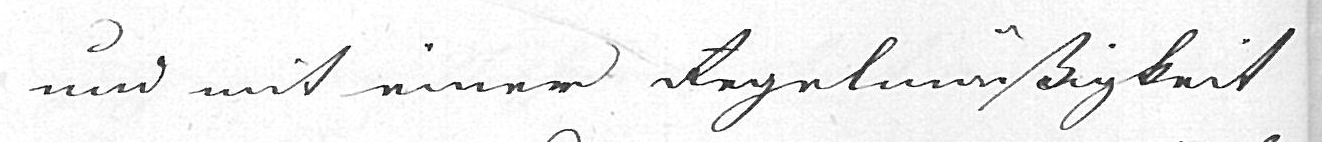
und mit einer Regelmäßigkeit
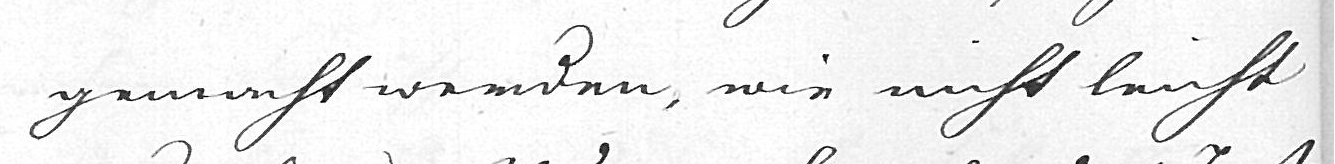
gemacht werden, wie nicht leicht
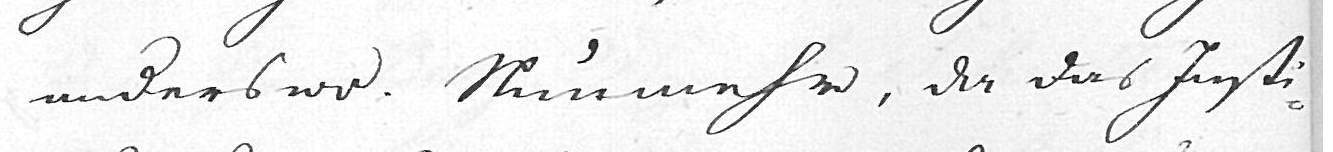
anderswo. Nunmehr, die das Insti-
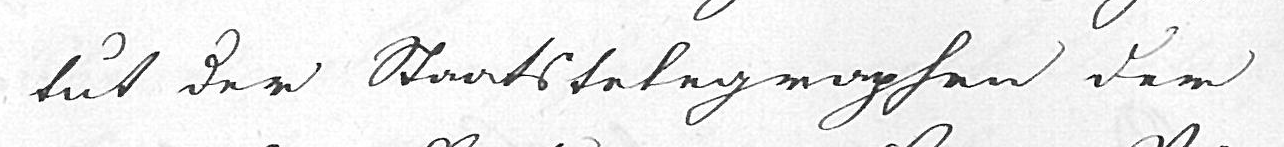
tut der Staatstelegraphen der
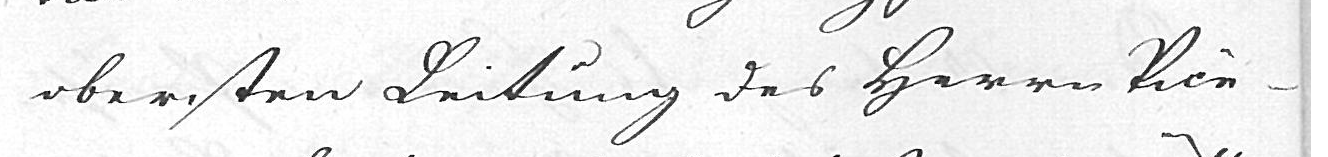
obersten Leitung des Herrn Vice-
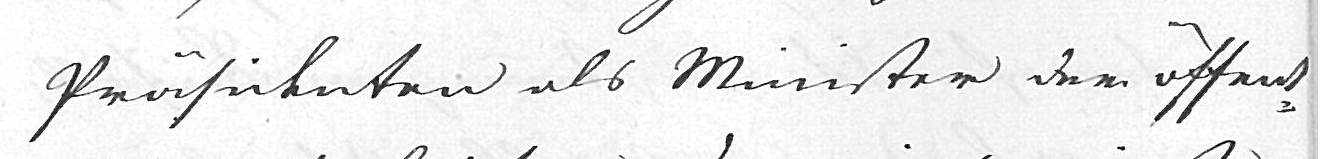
Präsidenten als Minister der öffent-
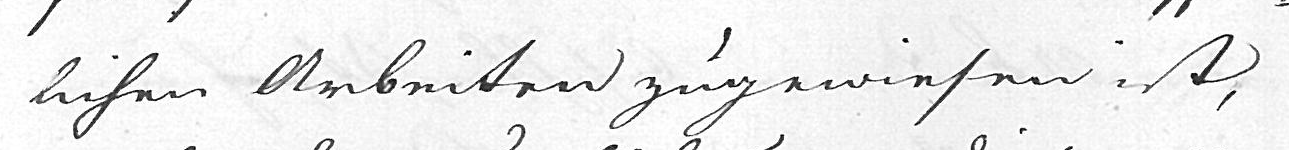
lichen Arbeiten zugewiesen ist,
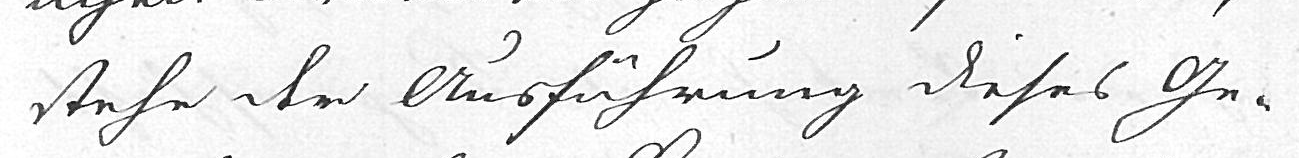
stehe der Ausführung dieses Ge-
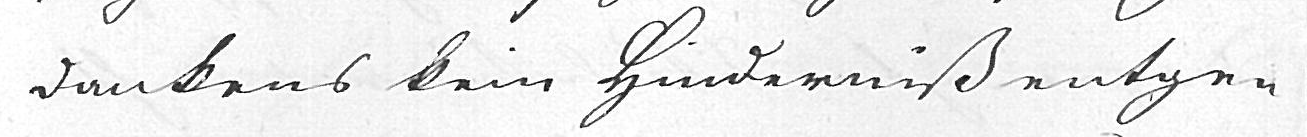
dankens kein Hinderniß entge-
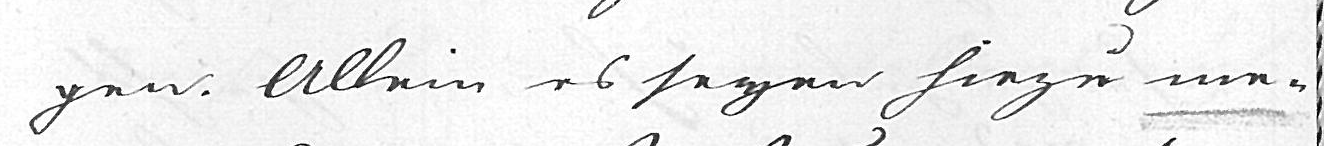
gen. Allein es seyen hiezu me-
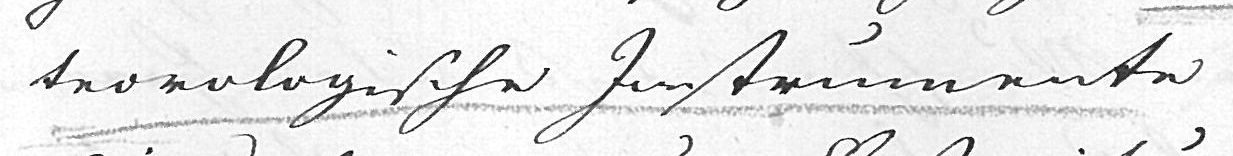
teorologische Instrumente
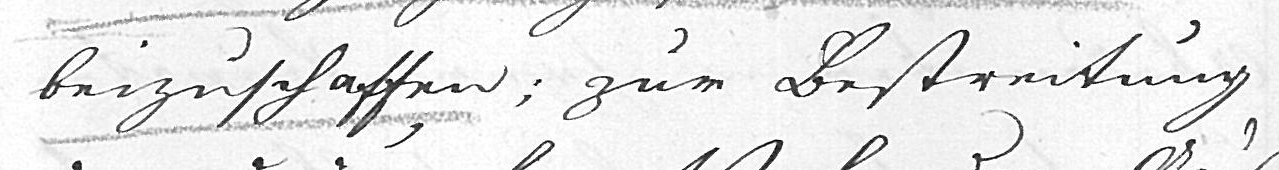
beizuschaffen; zur Bestreitung
